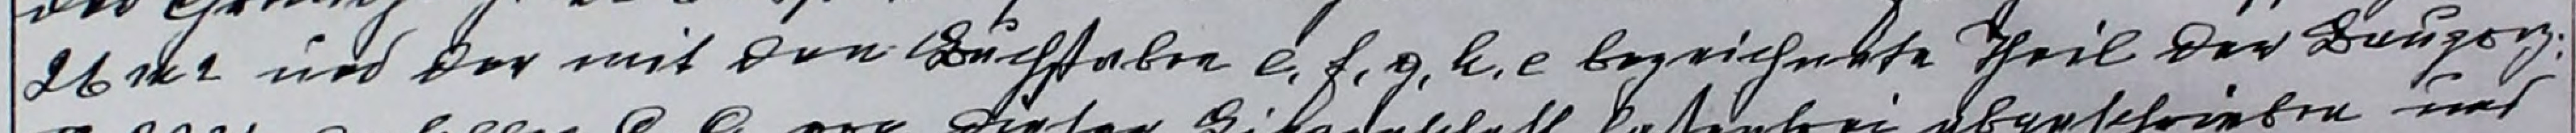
26 m 2 und der mit den Buchstaben e, f, g, h, e bezeichnete Theil der Bauparz:
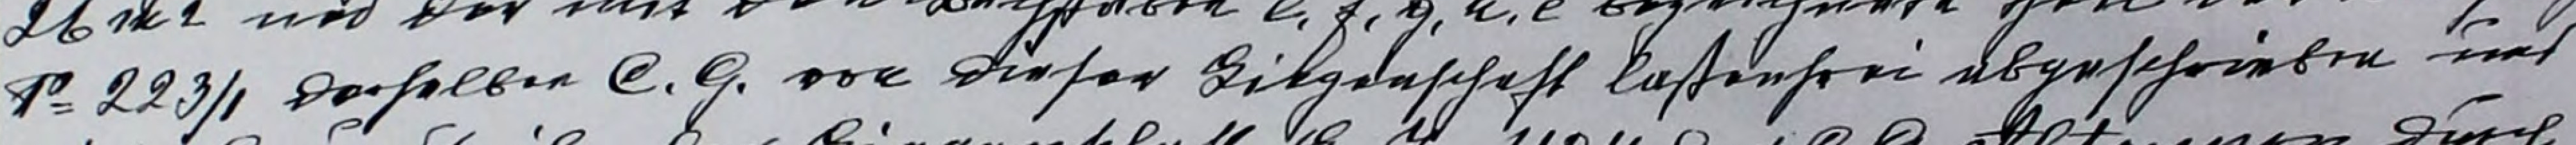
No 223/1 derselben C.G. von dieser Liegenschaft lastenfrei abgeschrieben und
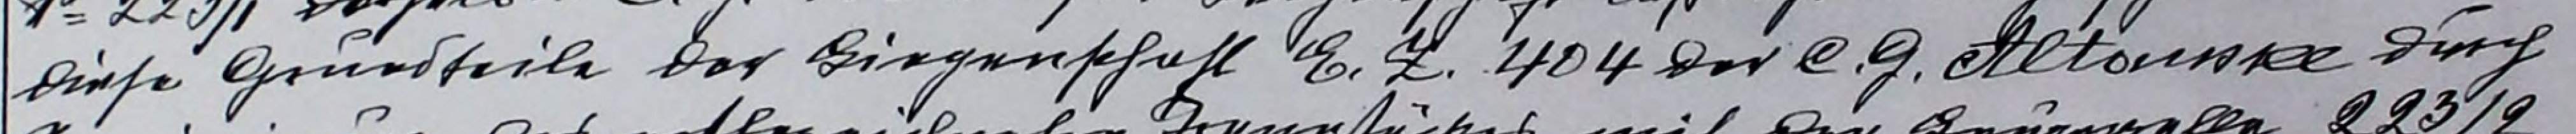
diese Grundteile der Liegenschaft E.Z. 404 der C.G. Altaussee durch
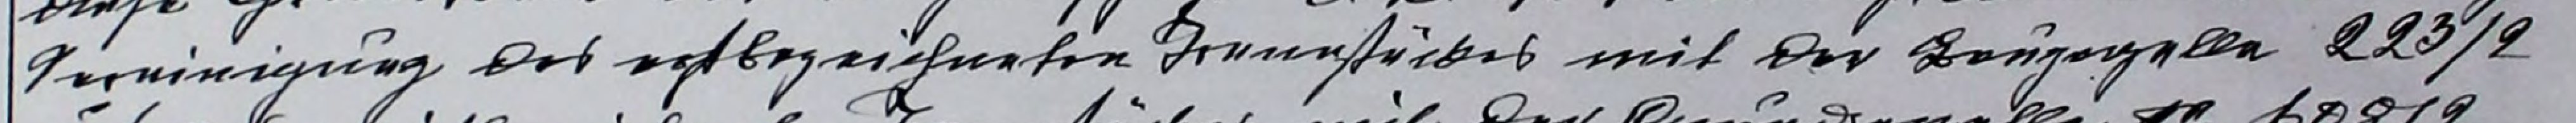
Vereinigung des arztbezeichneten Trennstückes mit der Bauparzelle 223/2
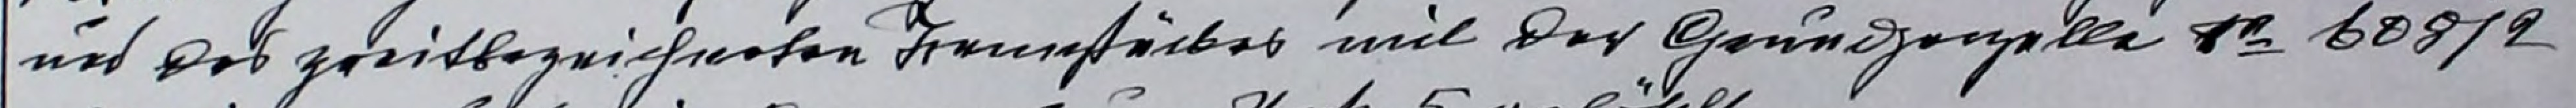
und des zweitbezeichneten Trennstückes mit der Grundparzelle No 608/2
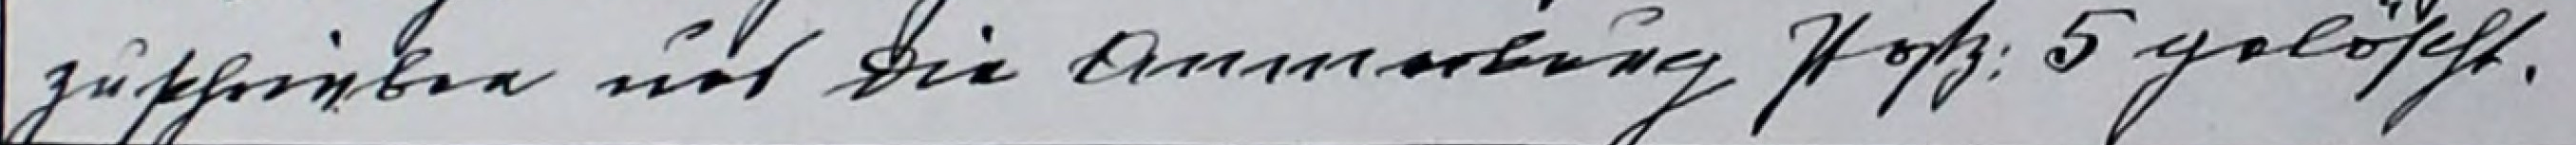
zuschrieben und die Anmerkung Postz: 5 gelöscht.
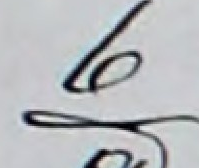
6
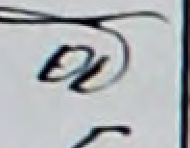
a
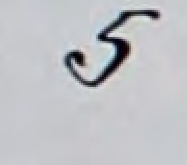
5
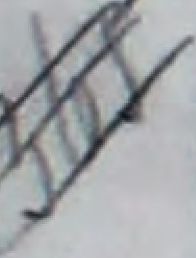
365
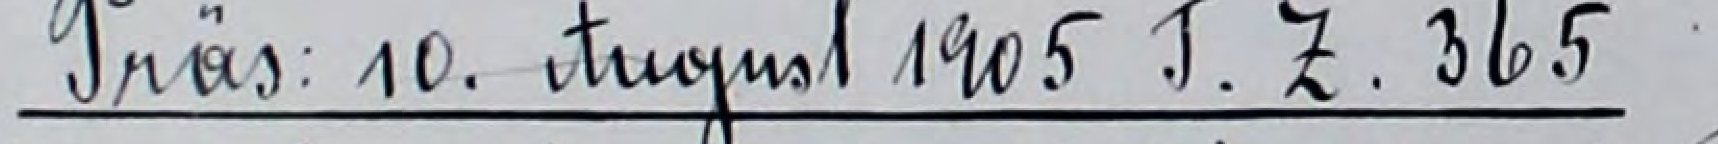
Präs: 10 August 1905 T.Z. 365
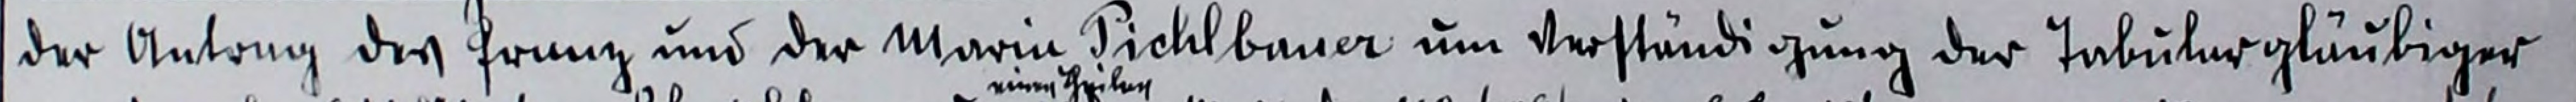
Der Antrag der Franz und der Maria Pichlbauer um Verständigung der Tabulargläubiger
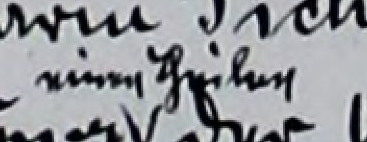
einen ???
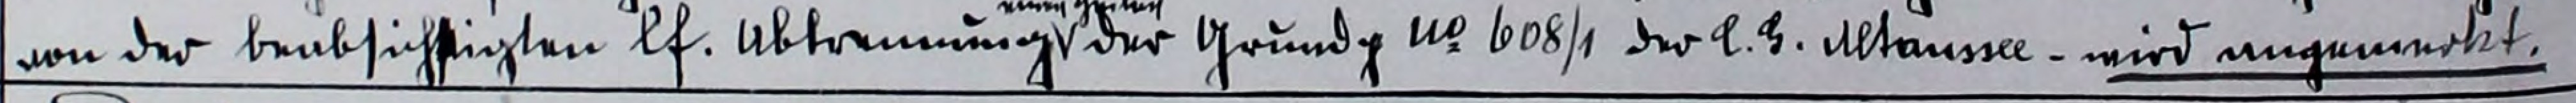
von der beabsichtigten lf. Abtrennung Grund p No 608/1 der C.G. Altaussee - wird angemerkt.
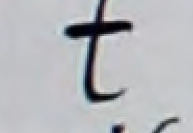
7
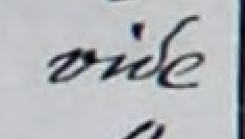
vide
